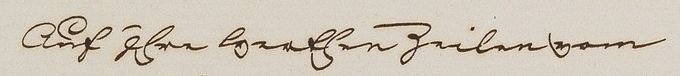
Auf Ihre werthen Zeilen vom
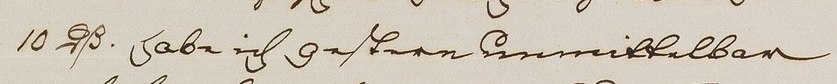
10 dß. habe ich gestern unmittelbar
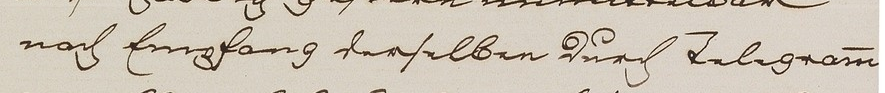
nach Empfang derselben durch Telegramm
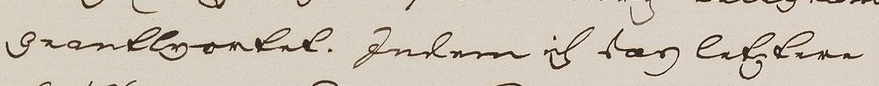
geantwortet. Indem ich das letztere
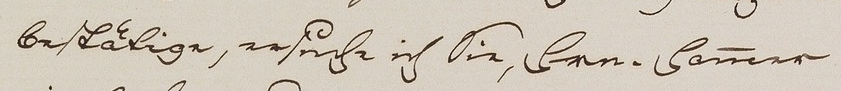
bestätige, ersuche ich Sie, Hrn. Hammer
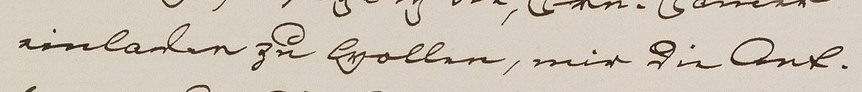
einladen zu wollen, mir die Ant-
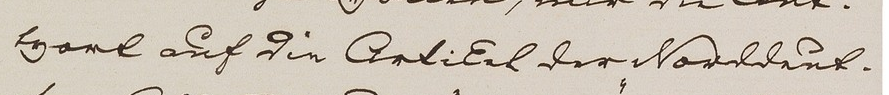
wort auf die Artikel der «Norddeut-
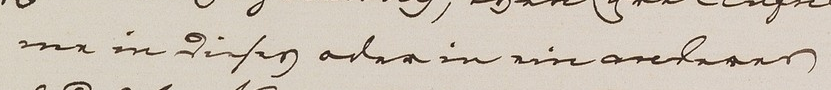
me in dieses oder in ein anderes
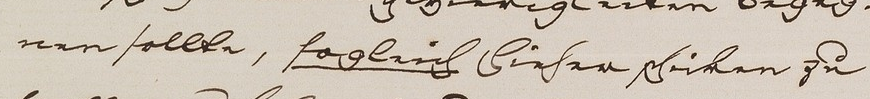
nen sollte, sogleich hieher schicken zu
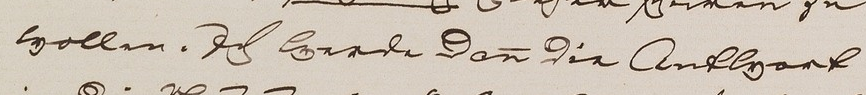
wollen. Ich werde dann die Antwort
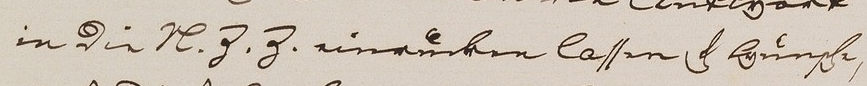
in die N.Z.Z. einrücken lassen & wünsche,
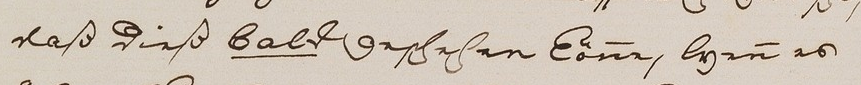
daß dieß bald geschehen könne, wenn es
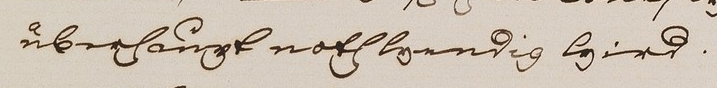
überhaupt nothwendig wird.
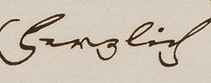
Herzlich
